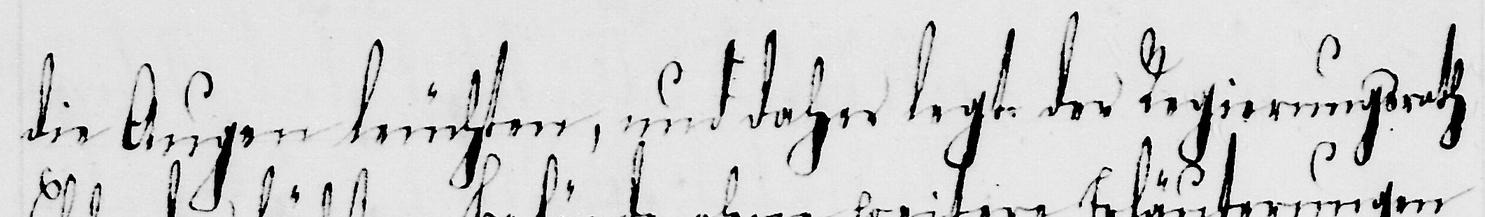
die Augen leuchten, und daher legte der Regierungsrath
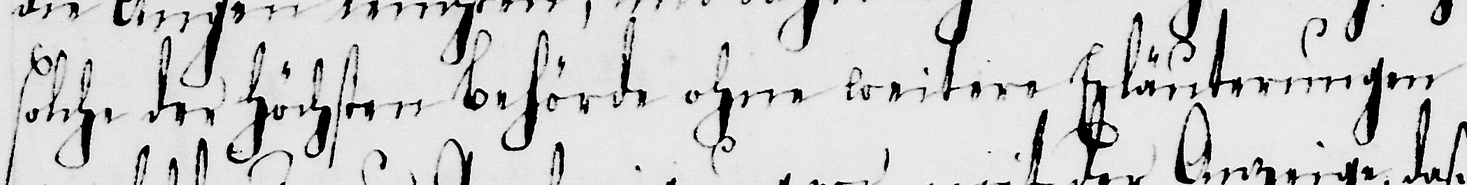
solche der Höchsten Behörde ohne weitere Erläuterungen
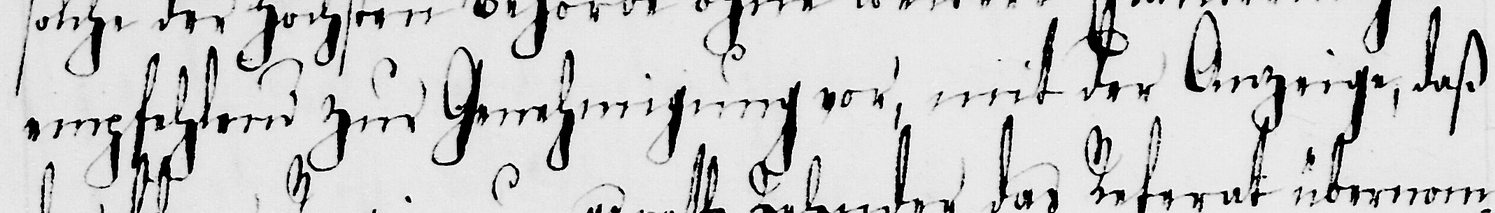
empfehlend zur Genehmigung vor, mit der Anzeige, daß
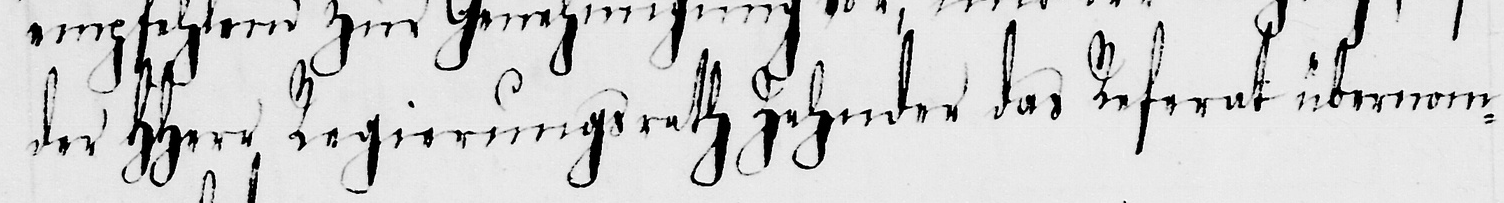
der HHerr Regierungsrath Zehnder das Referat übernom¬
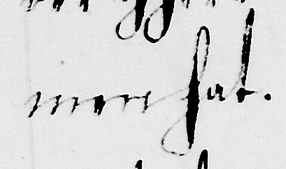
men hat.
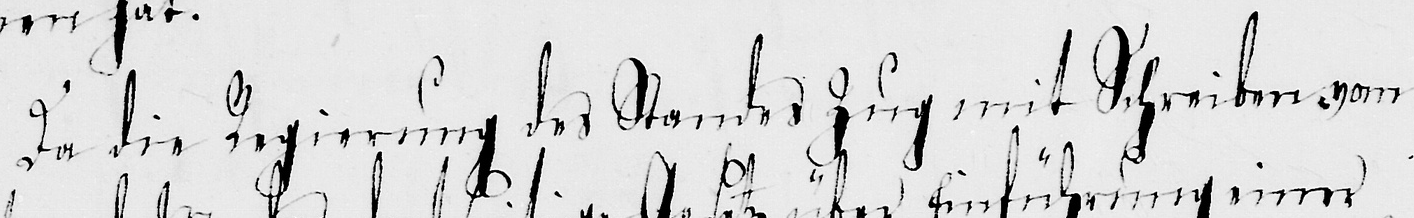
Da die Regierung des Standes Zug mit Schreiben vom
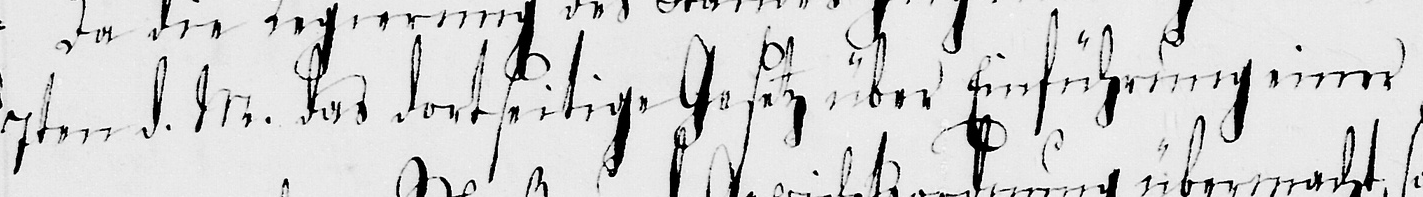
7ten d. M. das dortseitige Gesetz über Einführung einer
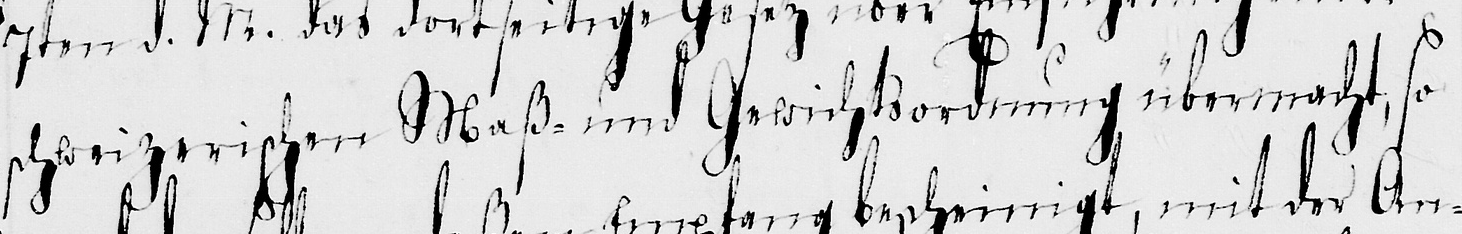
schweizerischen Maß- und Gewichtsordnung übermacht, so
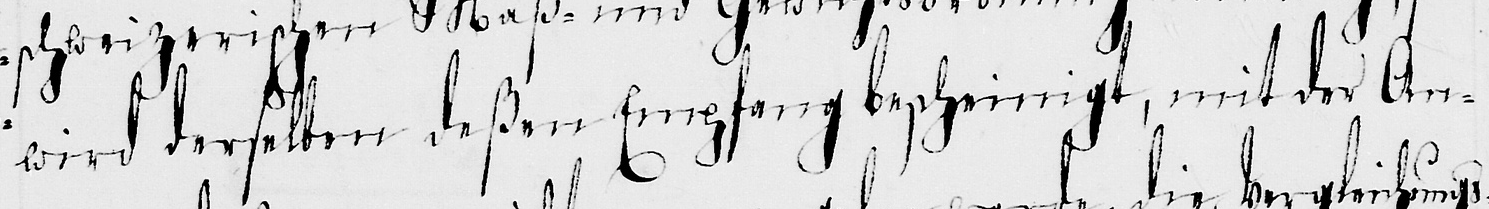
wird derselben deßen Empfang bescheinigt, mit der An¬
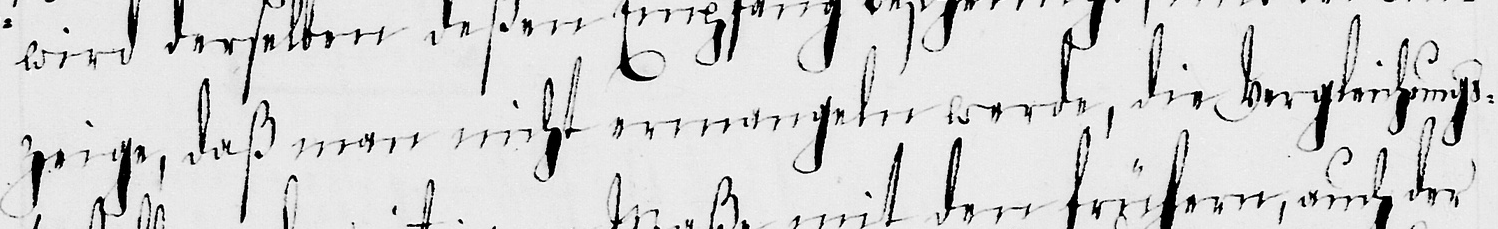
zeige, daß man nicht ermangeln werde, die Vergleichungs¬
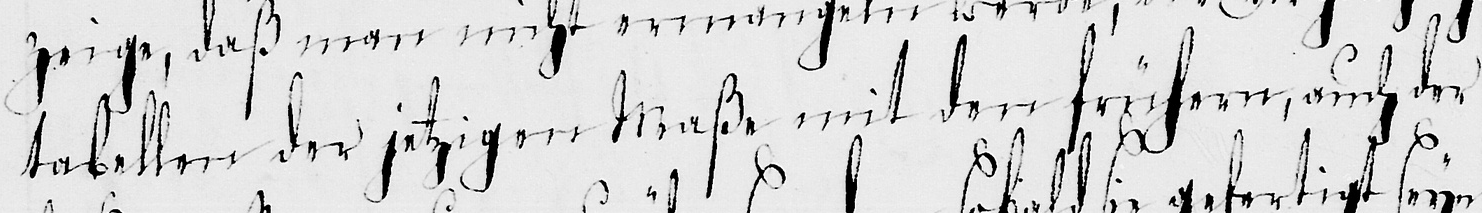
tabellen der jetzigen Maße mit den frühern, auch der
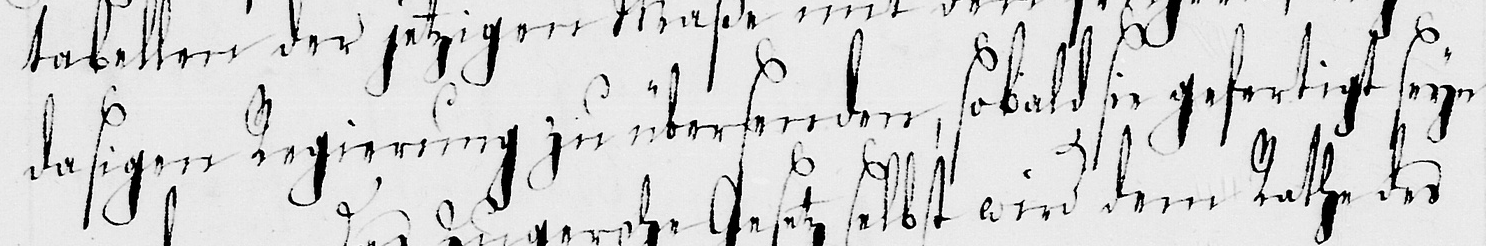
dasigen Regierung zu übersenden, sobald sie gefertigt seyn
